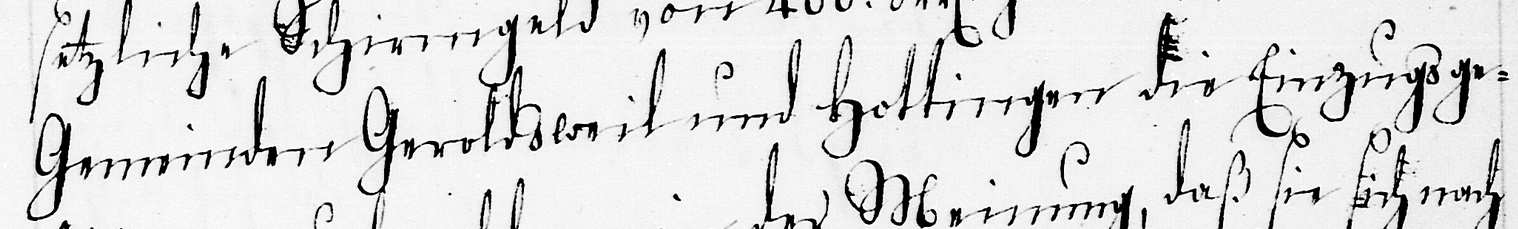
Gemeinden Geroldsweil und Hottingen die Einzugsge¬
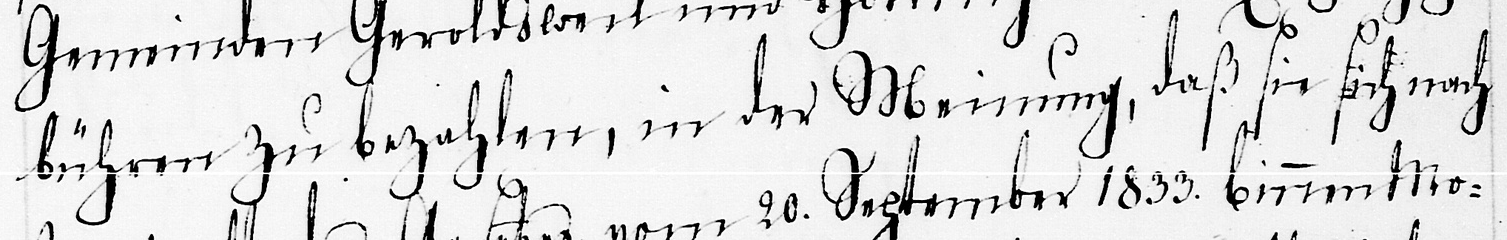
bühren zu bezahlen, in der Meinung, daß sie sich nach
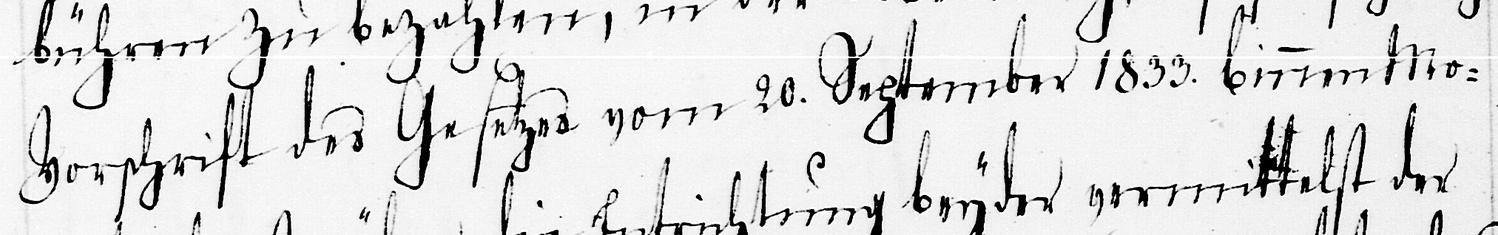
Vorschrift des Gesetzes vom 20. September 1833. binnen Mo¬
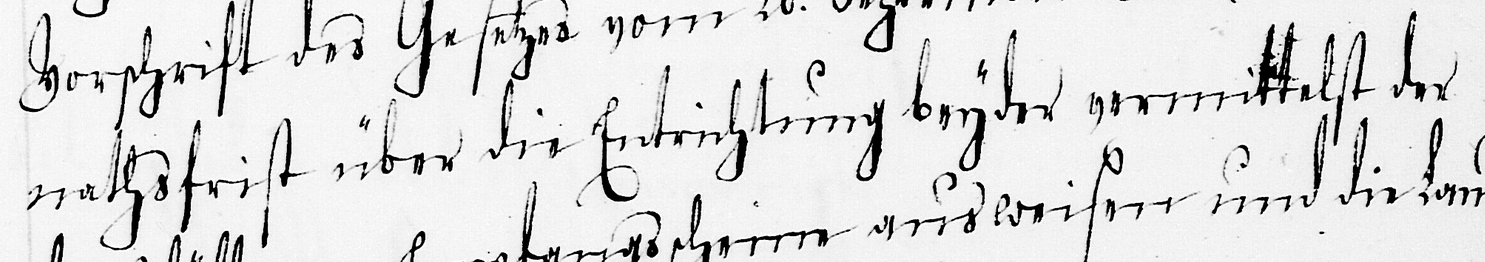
nathsfrist über die Entrichtung beyder vermittelst der
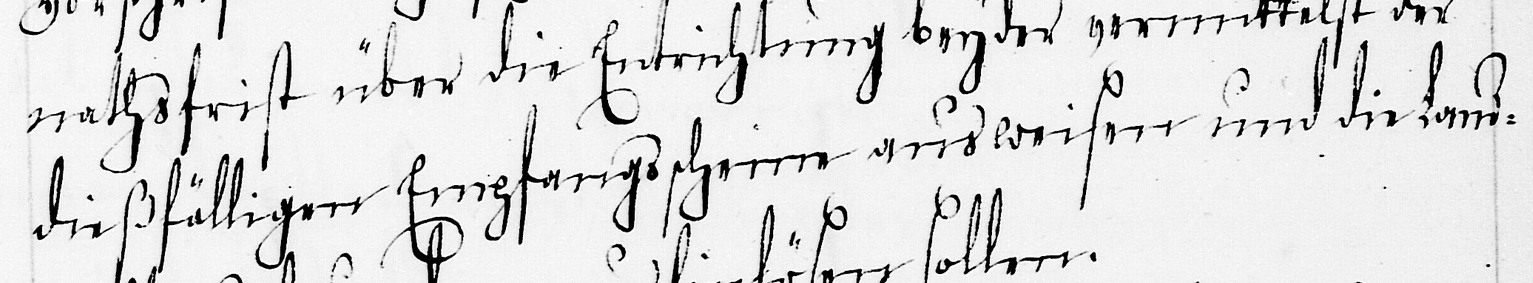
dießfälligen Empfangsscheine ausweisen und die Land¬
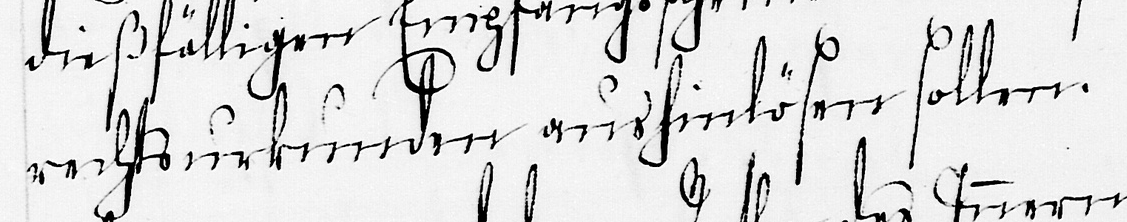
rechtsurkunden aushinlösen sollen.
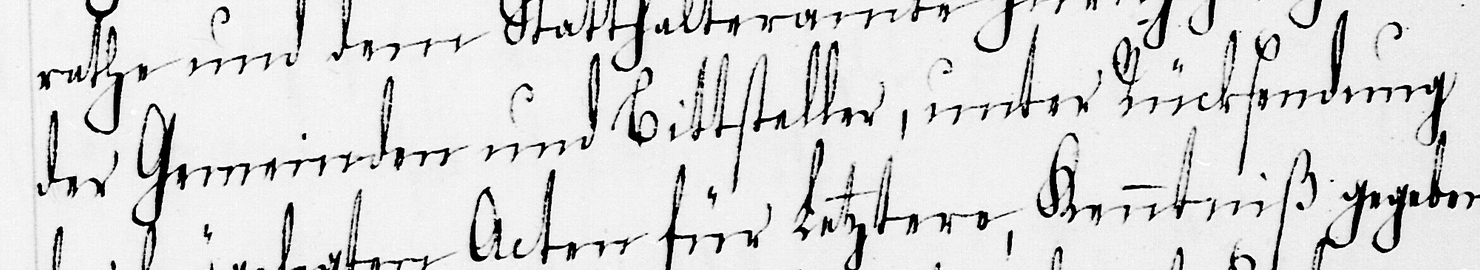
der Gemeinden und Bittsteller, unter Rücksendung
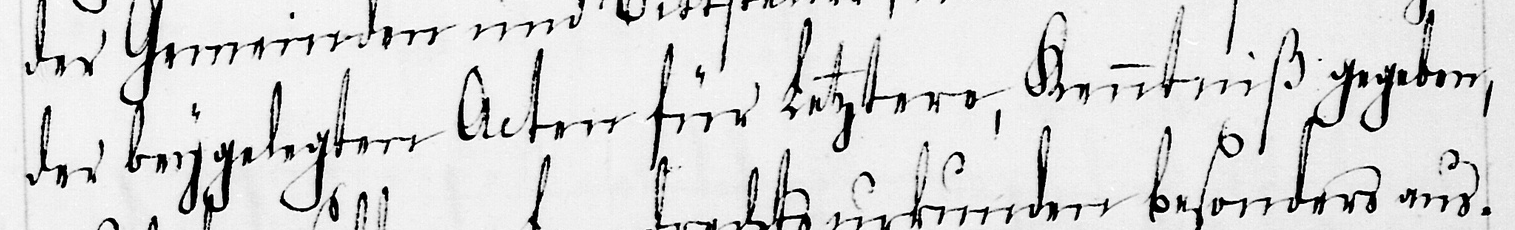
der beygelegten Acten für Letztere, Kenntniß gegeben,
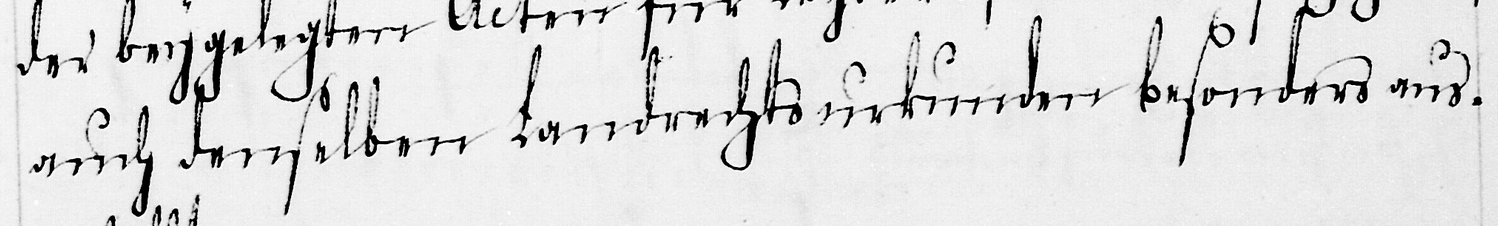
auch denselben Landrechtsurkunden besonders aus¬
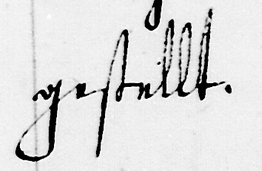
gestellt.
